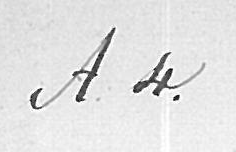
A 4.
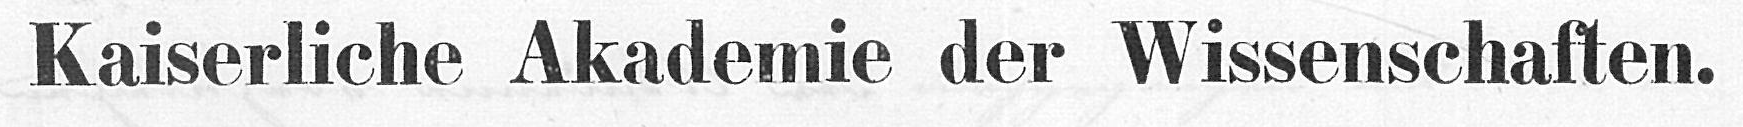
Kaiserliche Akademie der Wissenschaften
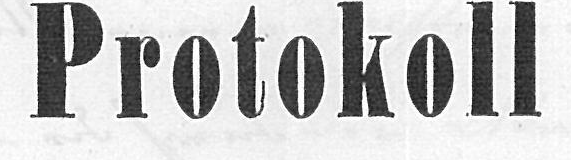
Protokoll
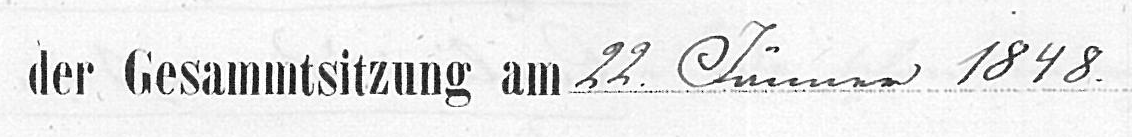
der Gesammtsitzung am 22. Jänner 1848
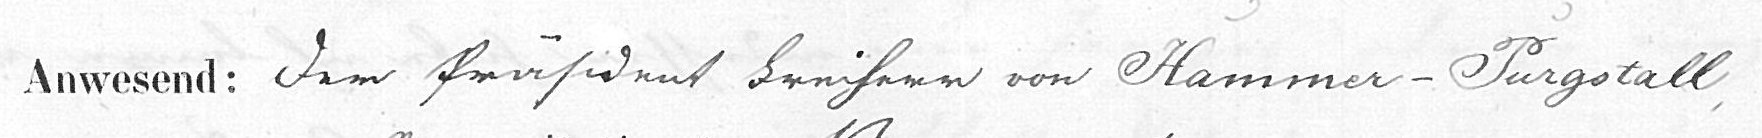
Anwesend: Der Präsident Freiherr von Hammer-Purgstall,
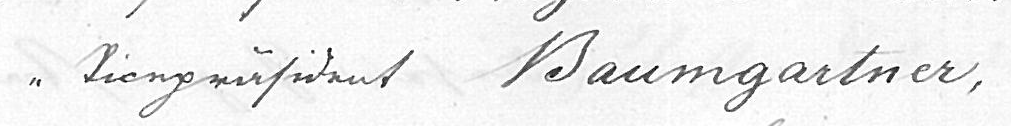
" Vicepräsident Baumgartner
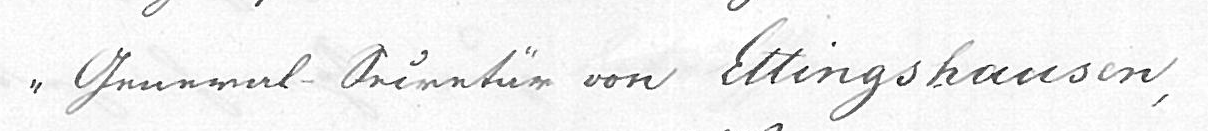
" General-Secretär von Ettingshausen,
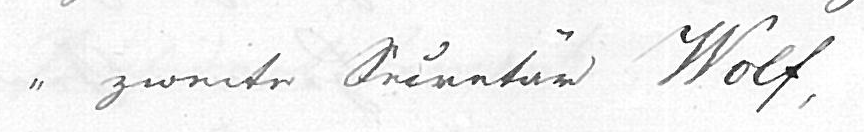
" zweiter Secretär Wolf,
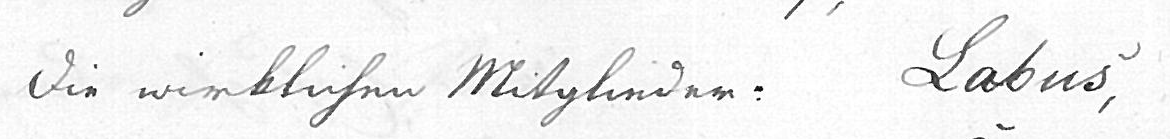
die wirklichen Mitglieder: Labus,
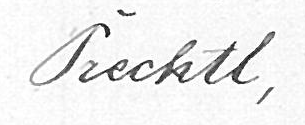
Prechtl,
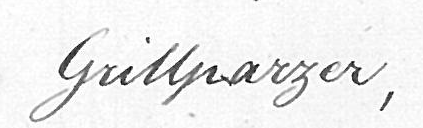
Grillparzer,
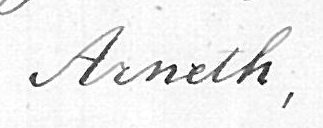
Arneth,
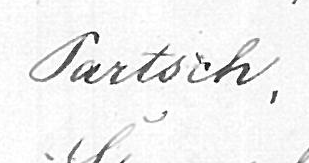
Partsch,
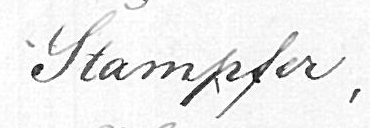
Stampfer,
